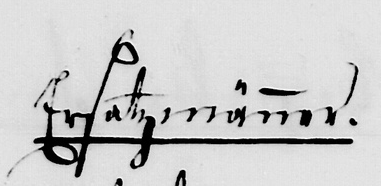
Ersatzmänner.
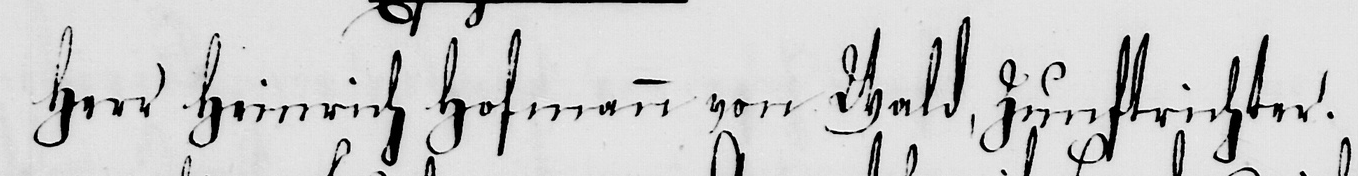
Herr Heinrich Hofmann von Wald, Zunftrichter.
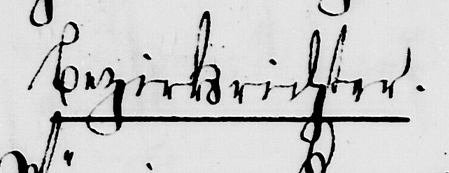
Bezirksrichter.
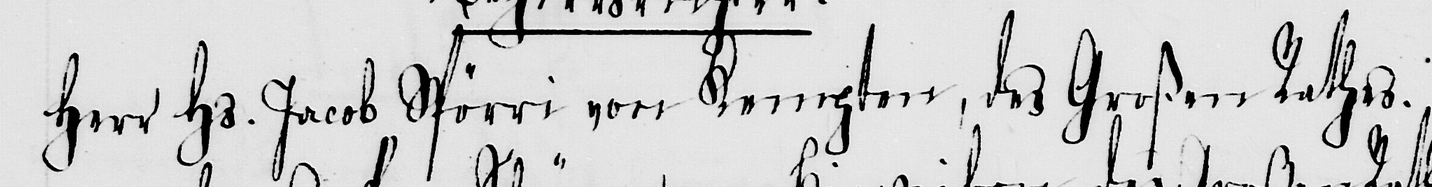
Herr Hs. Jacob Spörri von Kempten, des Großen Rathes.
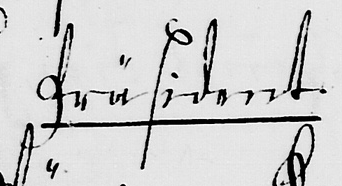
Präsident.
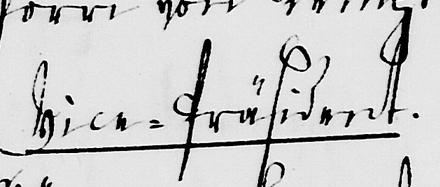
Vice-Präsident.
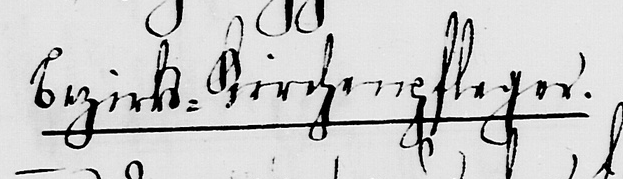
Bezirks-Kirchenpfleger.
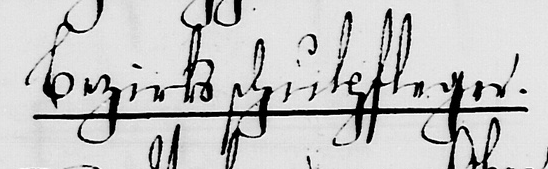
Bezirksschulpfleger.
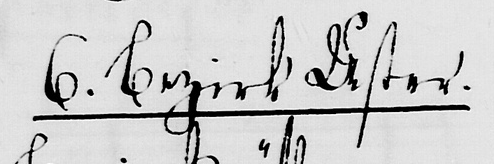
6. Bezirk Uster.
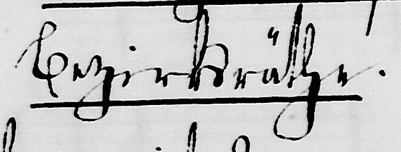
Bezirksräthe.
